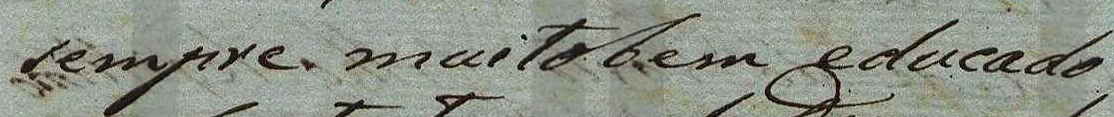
sempre muito bem educado
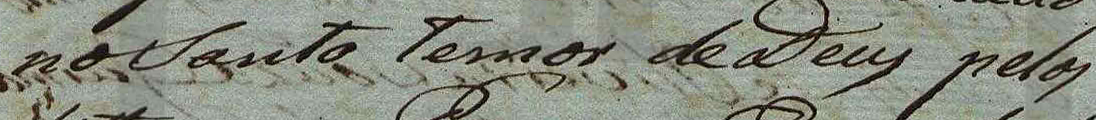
no Santo Temor de Deus pelos
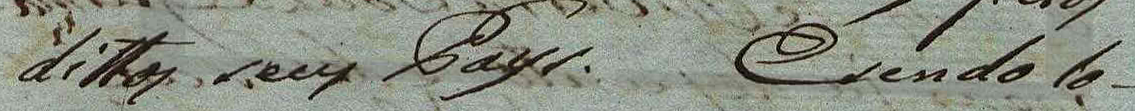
dittos seus Pays. E sendo lo
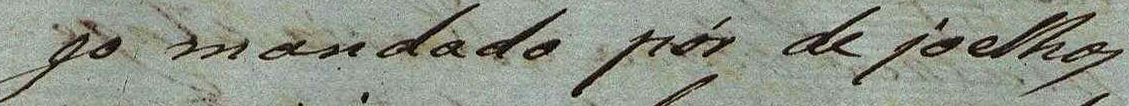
go mandado pór de joelhos
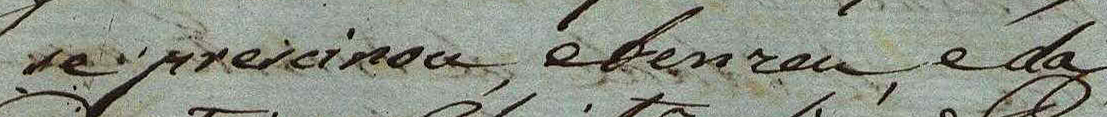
se prescinou, e benzeu, e da
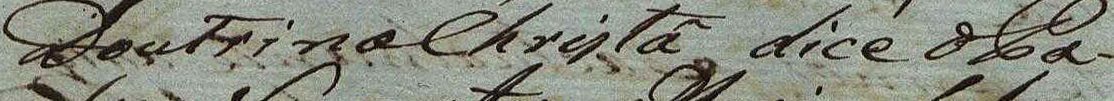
Doutrina Christã dice o Pa
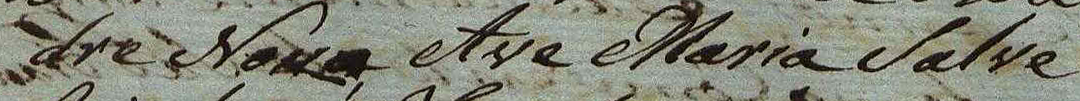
dre Nosso, Ave Maria Salve
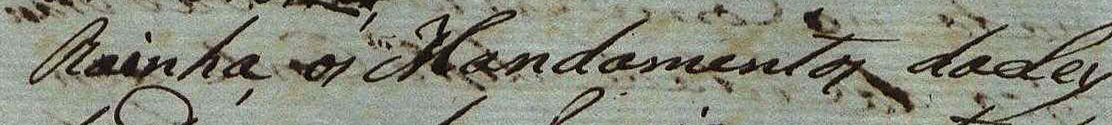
Rainha, os Mandamentos da Ley
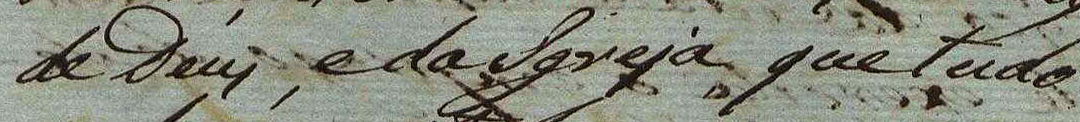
de Deus, e da Igreja, que tudo
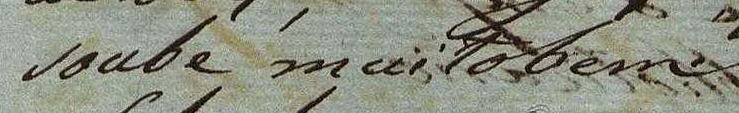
soube muito bem
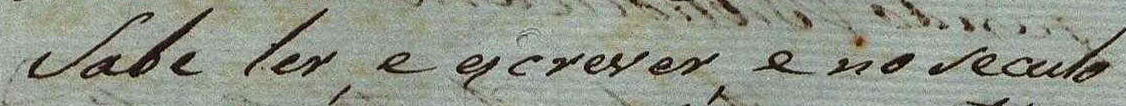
Sabe ler, e escrever, e no seculo
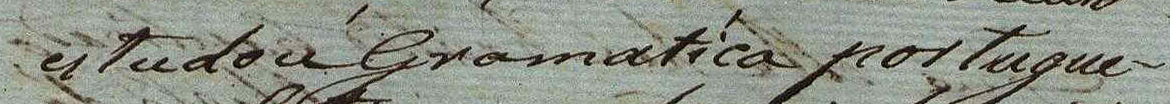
estudou Gramatica portugue
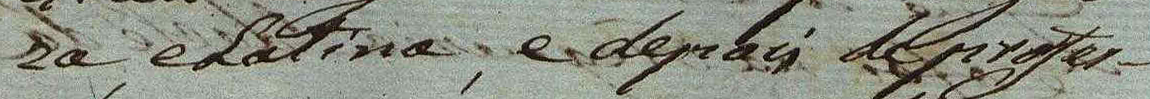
za e Latina, e depois de profes
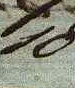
so
